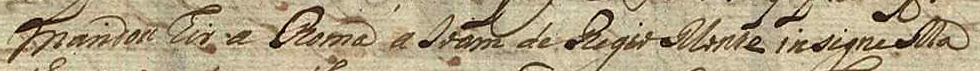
mandou hir a Roma a Ioam de Regio Monte insigne Ma
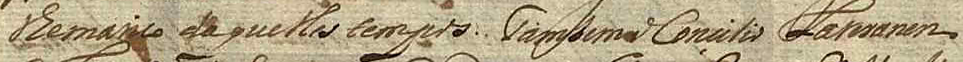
thematico daquelles tempos. Tambem o Conçilio Lateranen
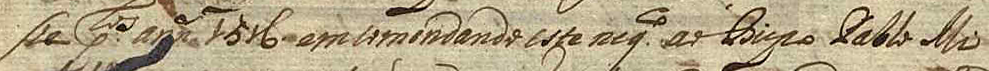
sse p.los ann.s 1516. emcomendando este neg.co ao Bispo Pablo Mi
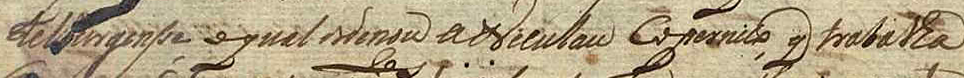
delburgensse, o qual ordenou a Niculau Copernico, q̄ trabalha
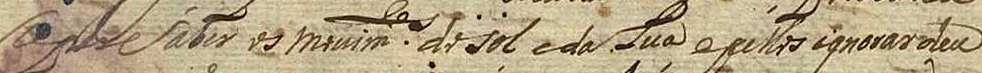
so por Saber os mouim.tos do sol e da Lua, e pellos ignorar deu
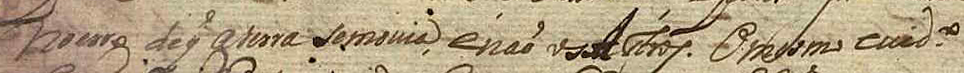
no erro de q̄ a terra se mouia, e naõ os Astros. O mesmo cuid.o
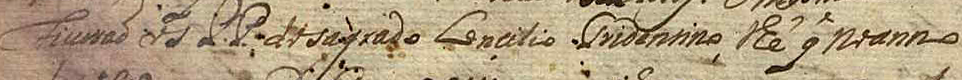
tiueraõ o s. P.P. do sagrado Concilio. Tridentino thé q̄ no anno
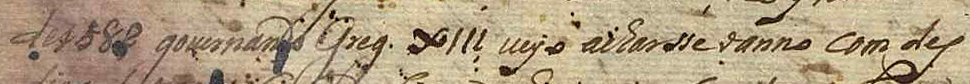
de 1582 gouernando Greg. X111, ueyo acharsse o anno com des
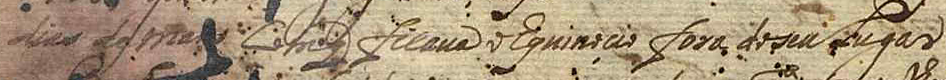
dias de ma_ Com q̄ ficaua o Equinocio fora do seu Lugar
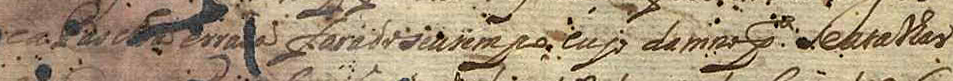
e a Pasch_a erra_a fora do seu tempo cujo damno p.a se atalhar
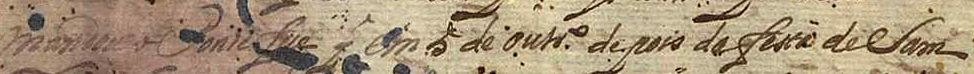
mandou o Pontefice q̄ em 5 de outr.o depois da festa de Sam
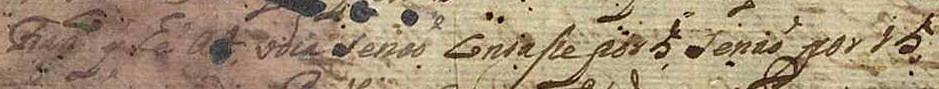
Fran.co q̄ he a 4 o dia senaõ contasse por 5, senaõ por i5,
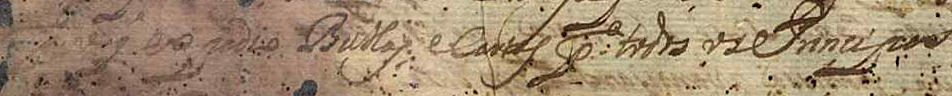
Foy o q̄ expedio Bullas, e Cartas p.a todos os Principes
